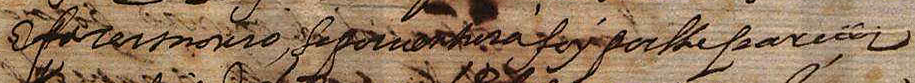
E fazer mouro, se por uentura foy por lhe parecer
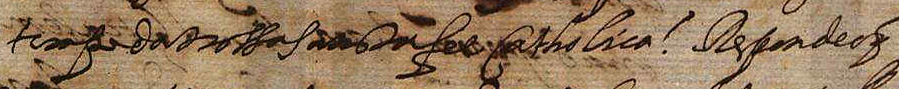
tempo da nossa sancta fee Catholica? Respondeo q̄
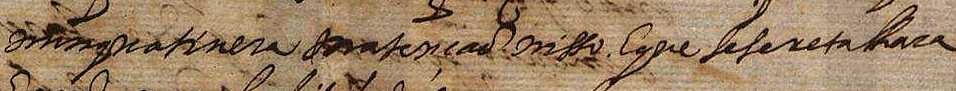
nunqua tiuera ma tençaõ nisso. E que se se retalhara
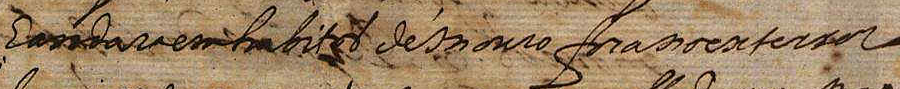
E andara em habito de Mouro fora no exterior
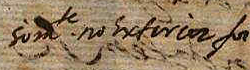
somte. no Exterior foi
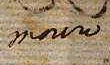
mouro
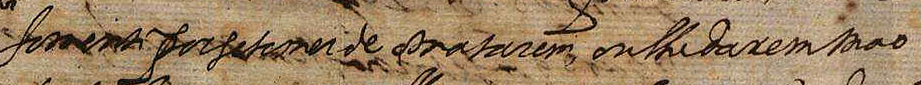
somente por se temer de o matarem, ou lhe darem mao
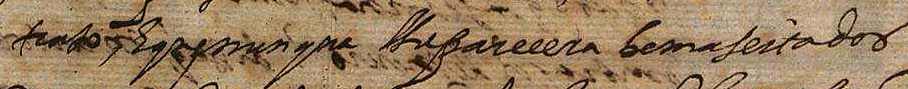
trato, E que nunqua lhe parecera bem a seita dos
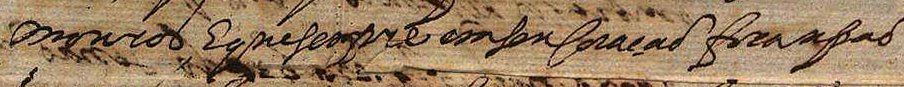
mouros, E que sempre em seu Coraçaõ fora xpaõ
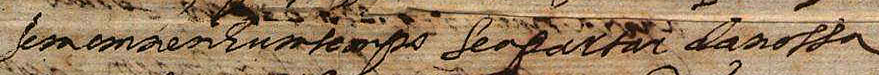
sem em nenhum tempo se apartar da nossa
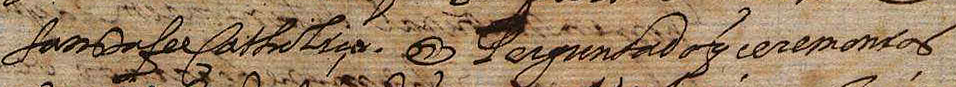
sancta fee Catholica. ⁋ Perguntado q̄ ceremonias
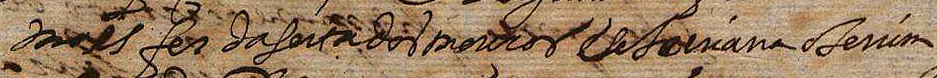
mais fez da seita dos mouros e se Ieiuaua o Ieium
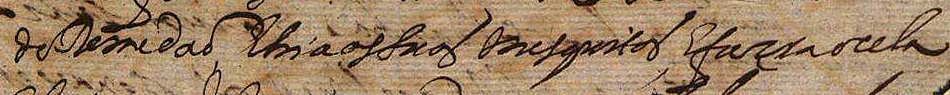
do Remedaõ, E hia as suas mesquitas, E fazia o cela
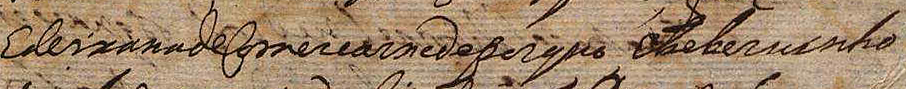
E deixaua de Comer carne de porquo E beber uinho
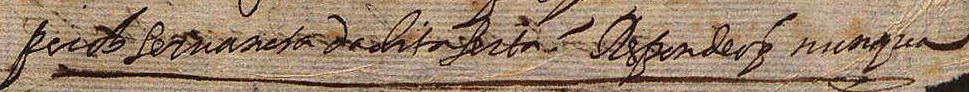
por obseruancia da dita seita? Respondeo q̄ nunqua
